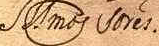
Ill.m̄os sorēs
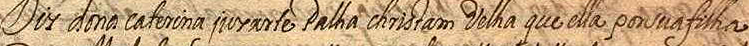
Diz dona caterina juzarte Palha christam Velha que ella por sua filha
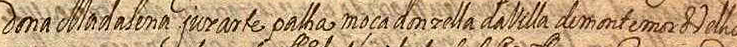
dona Madalena juzarte palha moça donzella da Villa de montemor o Velho
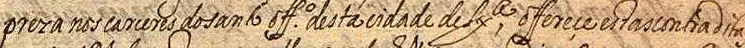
preza nos carceres do santo offo. desta cidade de Lxa, offerece estas contraditas.
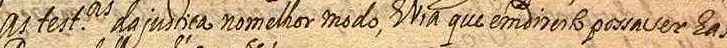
as test.as da justiça no melhor modo, E Via que em direito possa ser E as
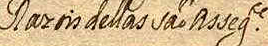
Razois dellas são as seg.tes
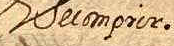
E se comprir.
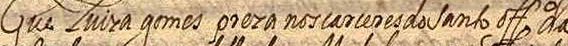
Que Luiza gomes preza nos carceres do santo offo. da
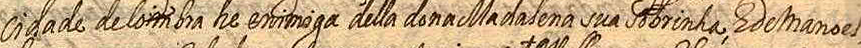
cidade de Coimbra he enimiga della dona Madalena sua sobrinha, E de manoel
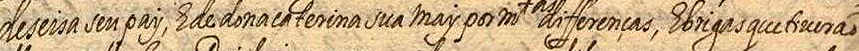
de seisa seu pay, E de dona caterina sua may por mtas differenças, E brigas que tiuerão
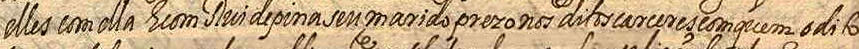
elles com ella E com Rui de pina seu marido prezo nos ditos carceres com quem o dito
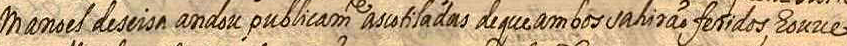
manoel de seisa andou publicamte as cotiladas de que ambos sahirão feridos, E ouue
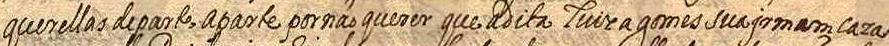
querellas de parte a parte por não querer que a dita Luiza gomes sua jrmam cazas
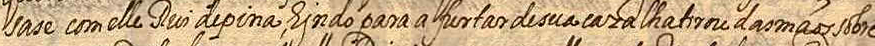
sase com elle Rui de pina, E jndo para a furtar de sua caza lha tirou das mãos sobre
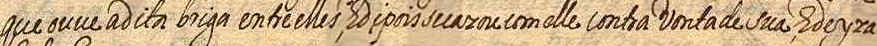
que ouue a dita briga entre elles, E dipois se cazou com elle contra Vontade sua, E de yza
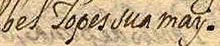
bel Lopes sua may.
